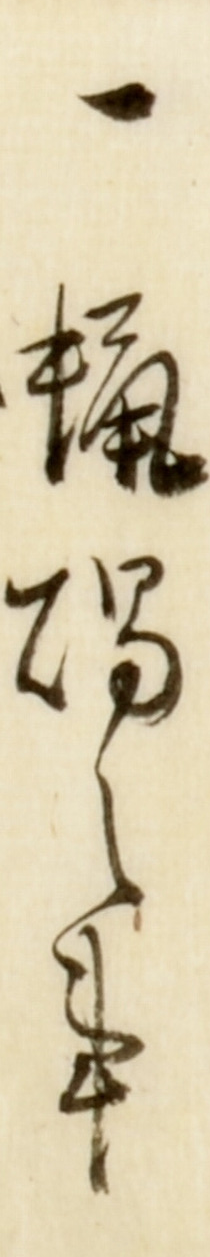一蝋燭之事
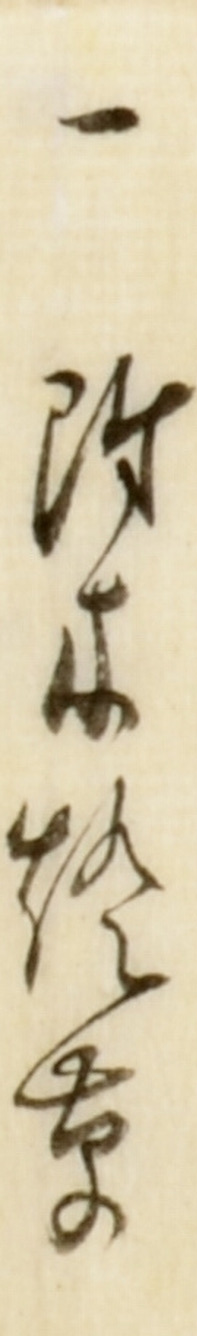一附木燈草

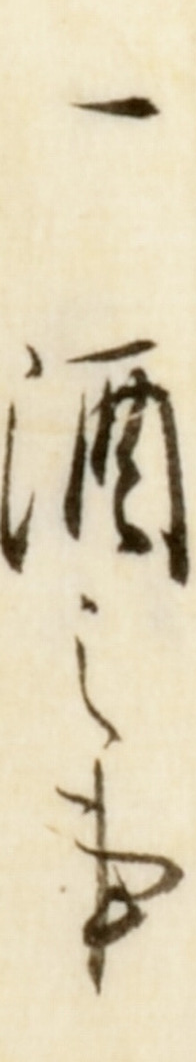一酒之事
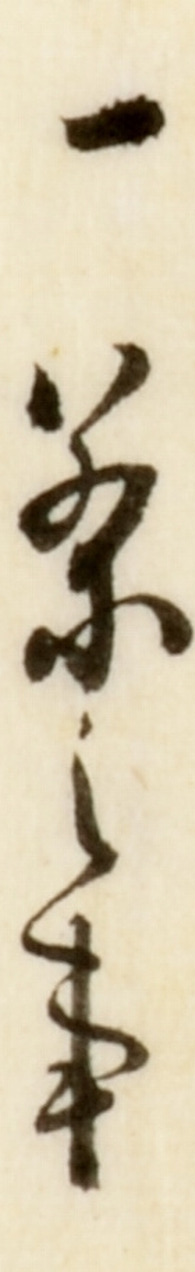一茶之事
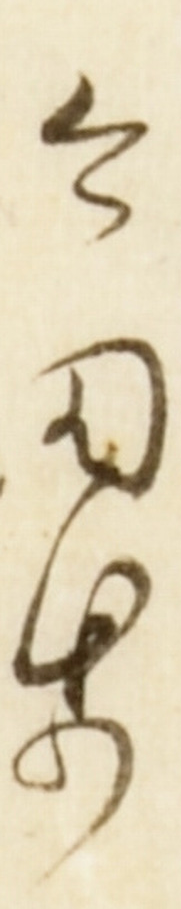今田紙
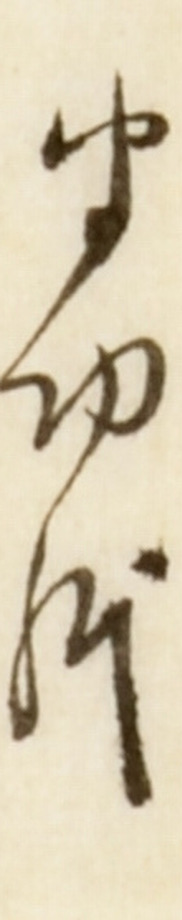半切紙
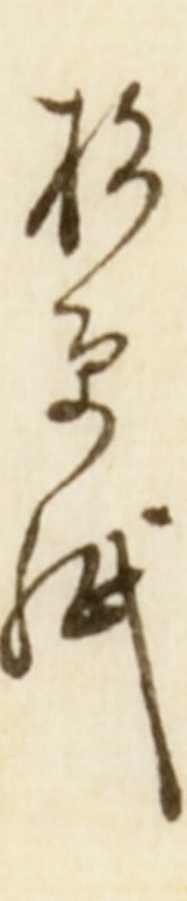杉原紙
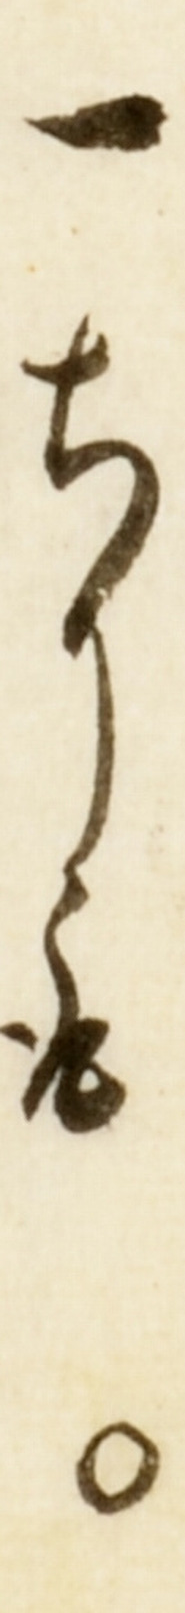一ちり取○
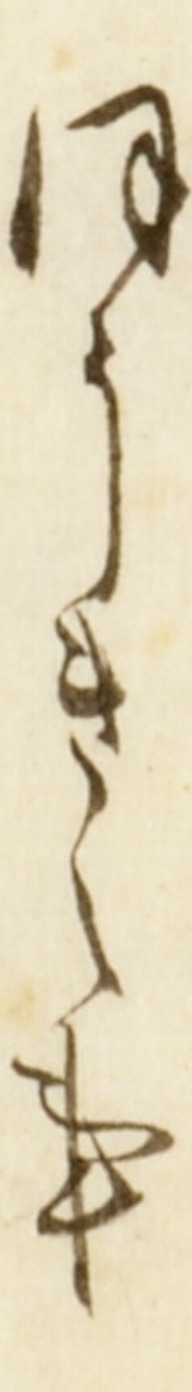ほうき之事
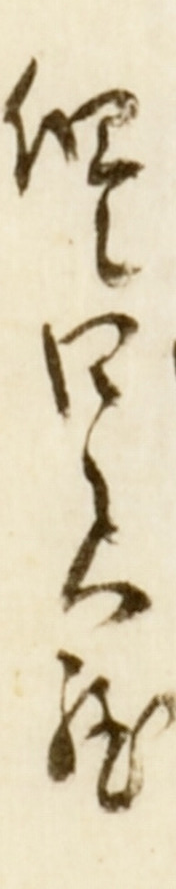但し四尺程
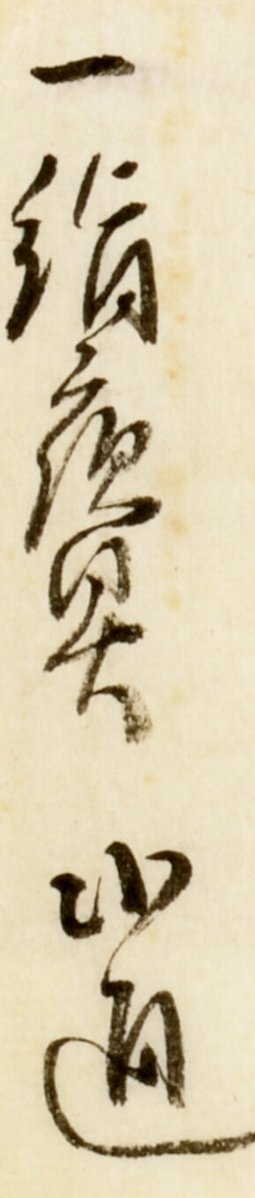一絹夜具弐通
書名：覚
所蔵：伊那市立高遠町図書館・合同会社AMANE
